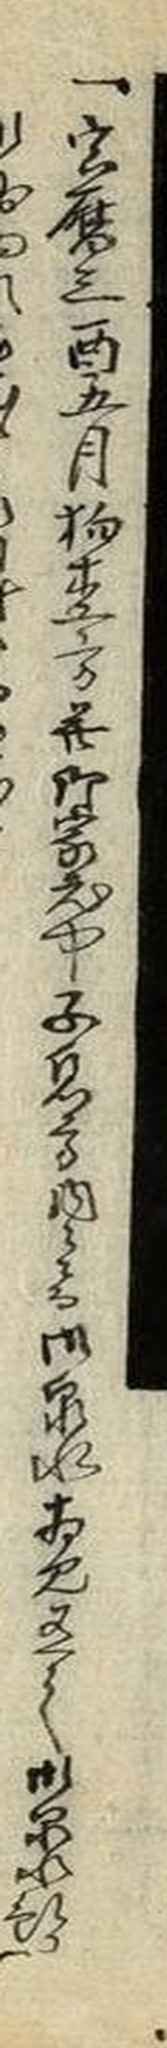一宝暦三酉五月狛杢方并御家老中子息方内々にて御泉水拝見有之御泉水預り
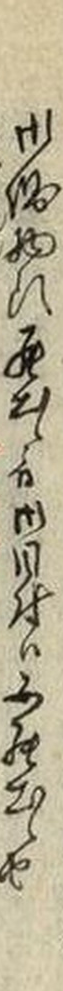御側物頭罷出候に付御目付は不罷出候由
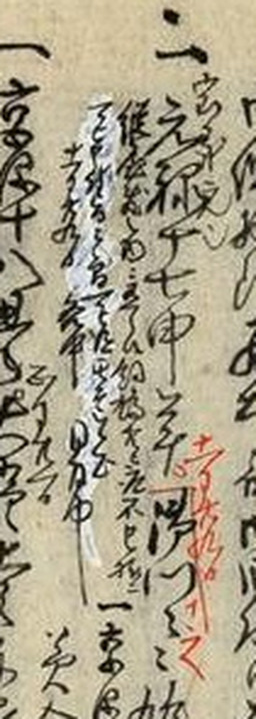従屋敷之内に有之候飼鳩共も取不申候様に
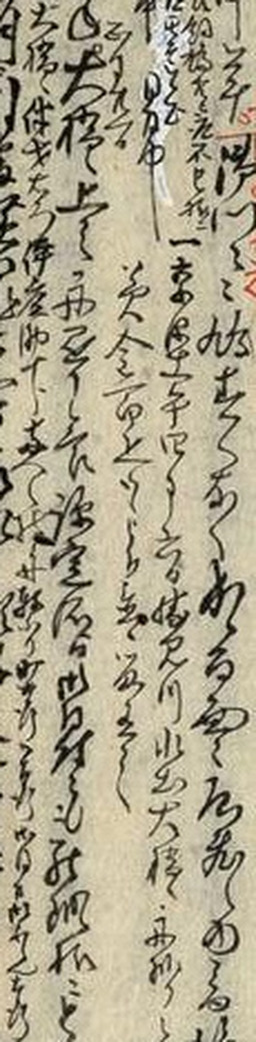美金百疋ツヽ被下置候留有之
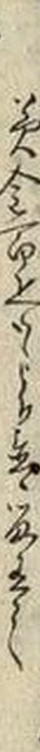美金百疋ツヽ被下置候留有之
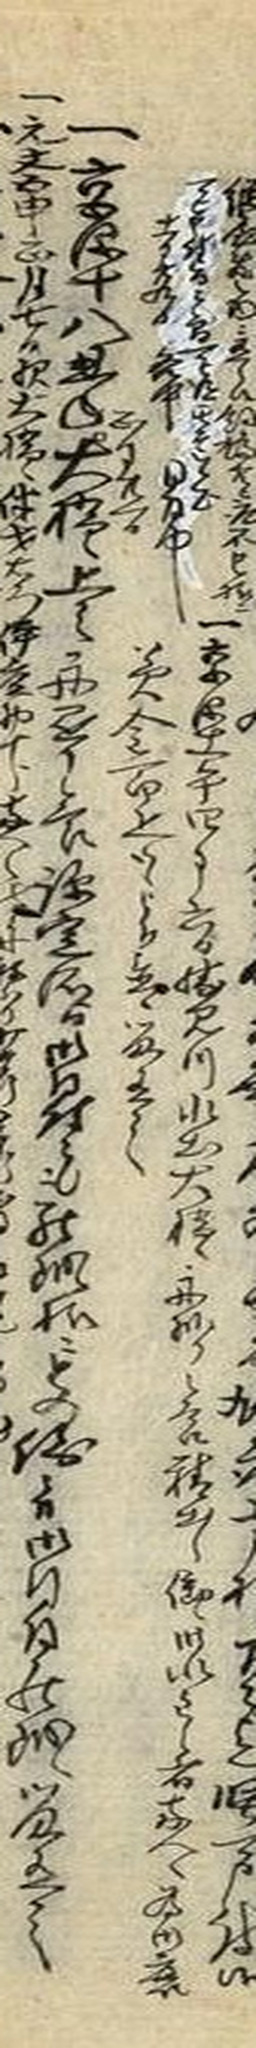一享保十八丑年◦正月廿一日大橋之上之舟懸り之節評定所ゟ御目付にも罷越候様にとの儀に付御目付罷越候留有之
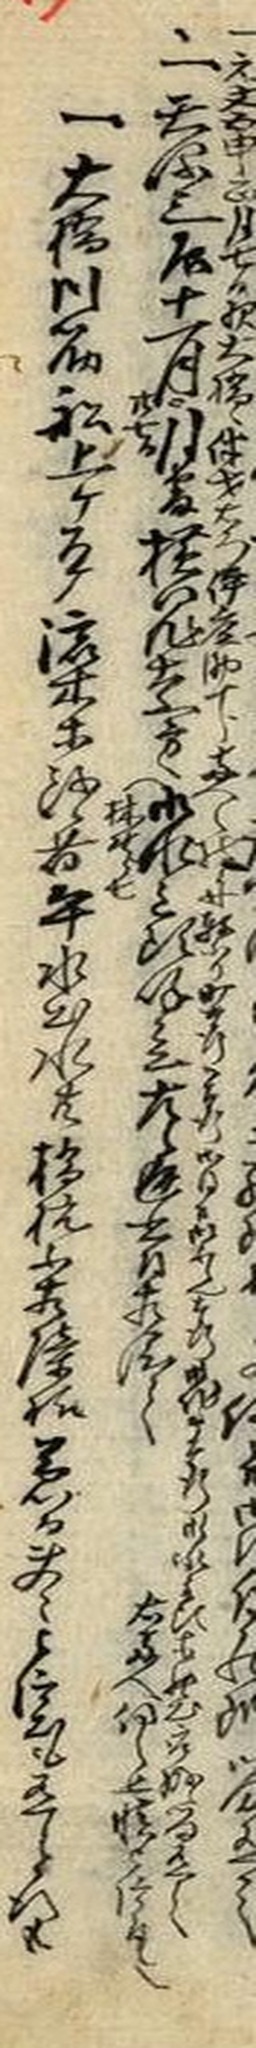一大橋川筋船上ケ下ケ流木等致候者平水出水共橋杭不相障様兼て夫々被仰出も有之候得共

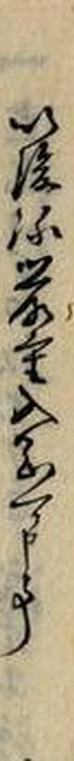以後弥厳重入念可申事
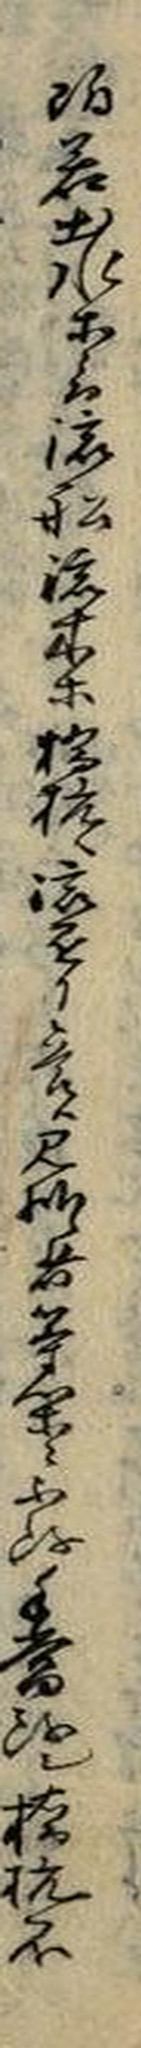附若出水等にて流船流木等橋杭へ流懸り候節は見掛候者等閑に不致手当致シ橋杭不
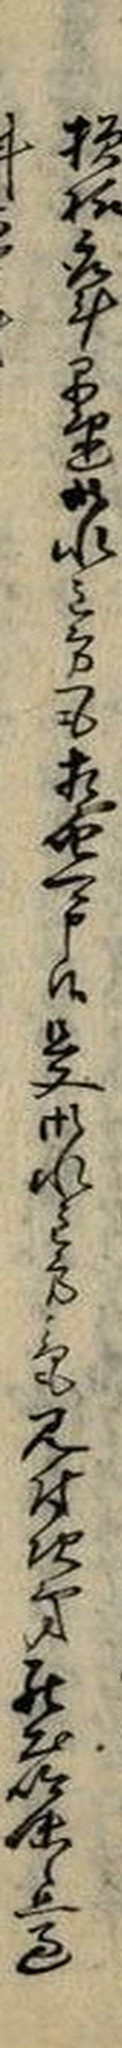損様取斗早速御水主方へも相届可申候且又御水主方にても見付次第罷出吟味之上過
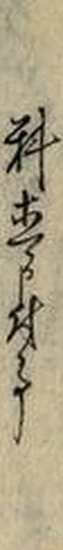料等可申付事
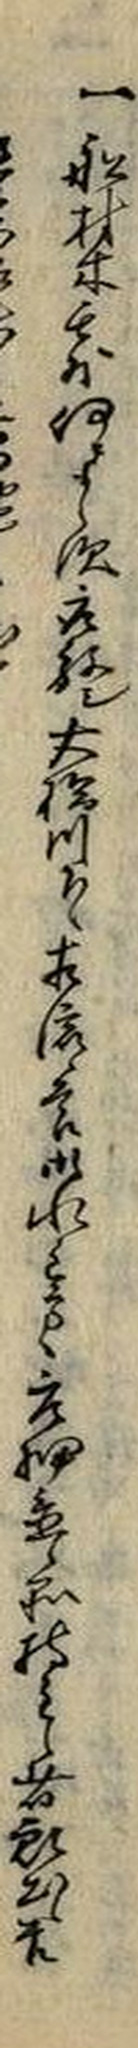一船材木其外何によらす取放シ大橋川下へ相流候節御水主方へ取押置候品持主之者願出候節
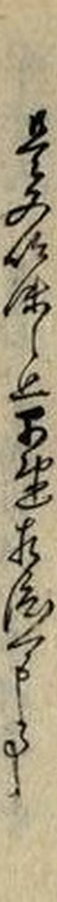是又吟味之上早速相渡可申事
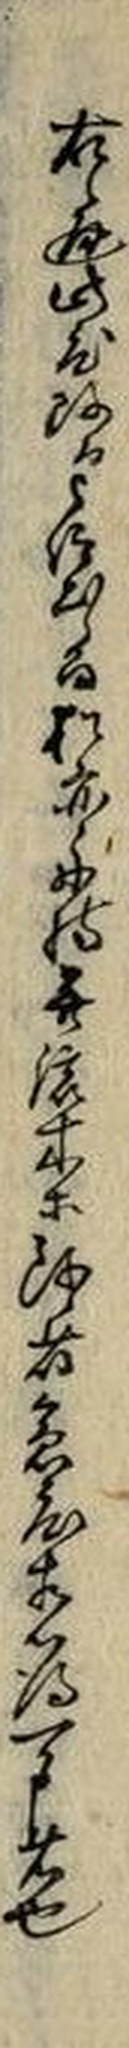右之通此度改て被仰出候間猶亦舟持并流木等致候者急度相心得可申者也
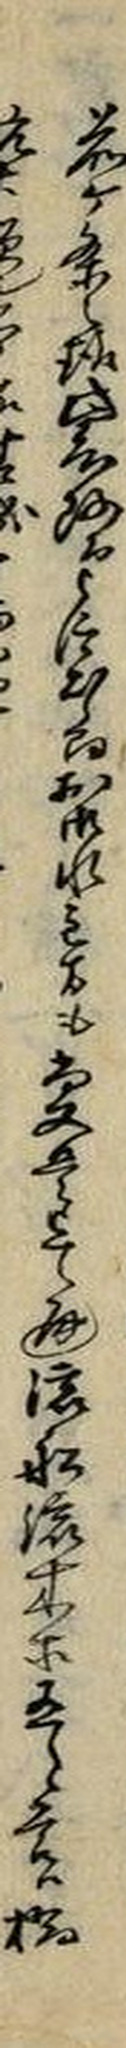前ケ条之趣此度改て被申出候間於御水主方も尚又是迄之通流船流木等有之候節は橋
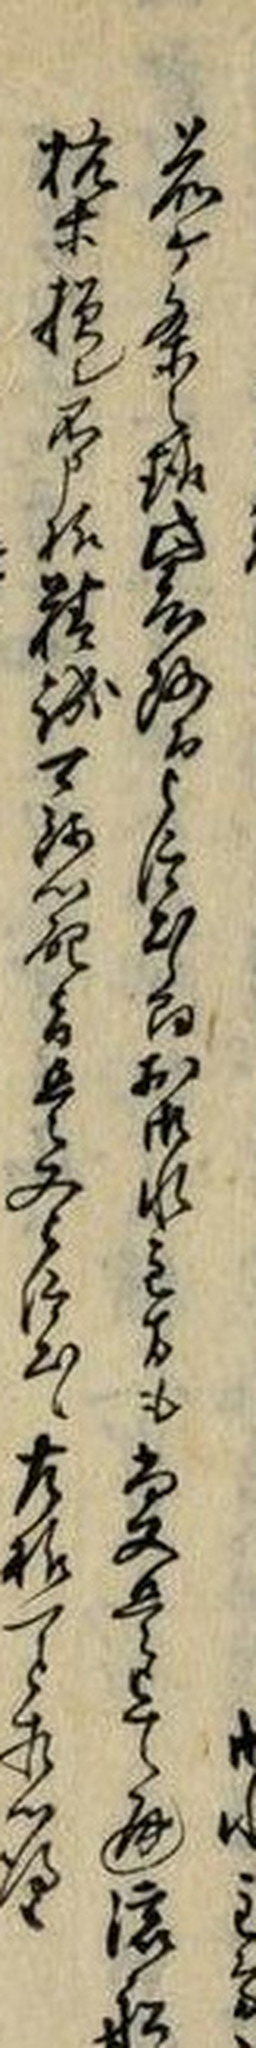杭等損シ不申様精誠可致心配旨是又被仰出候左様可被相心得候
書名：御城下諸事之部
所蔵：福井県文書館 Fukui Prefectural Archives
